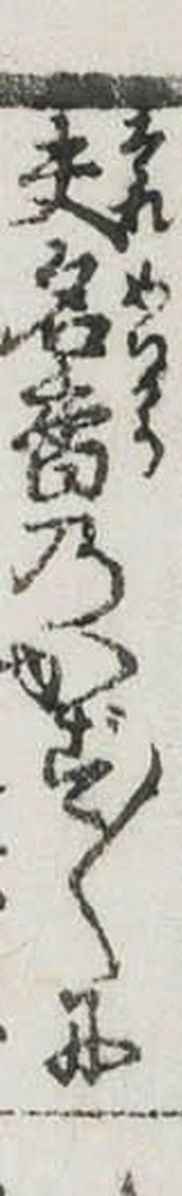夫名香のかず〳〵に
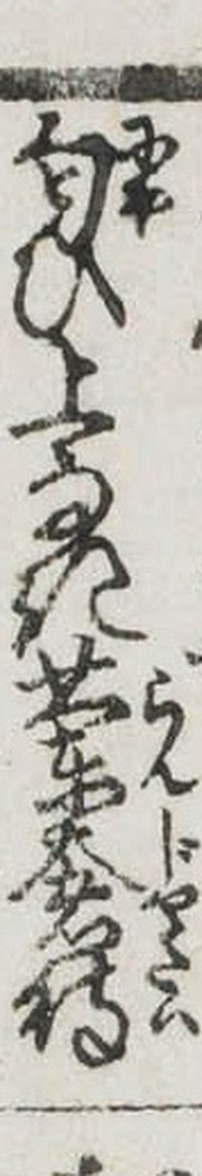匂ひ上なき蘭奢待
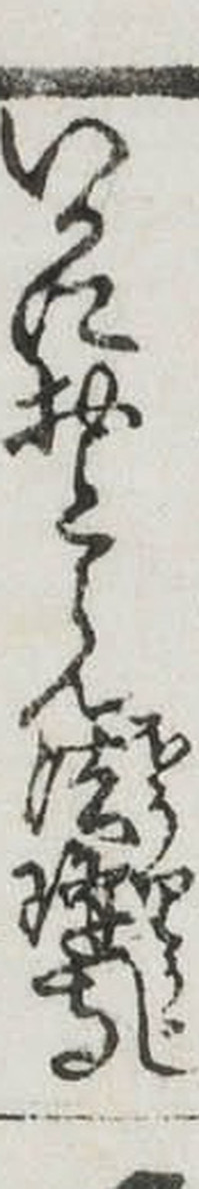いかにおとらん法隆寺
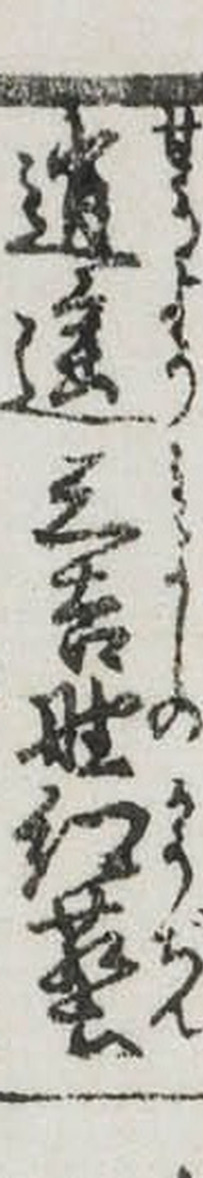逍遥三吉野紅塵
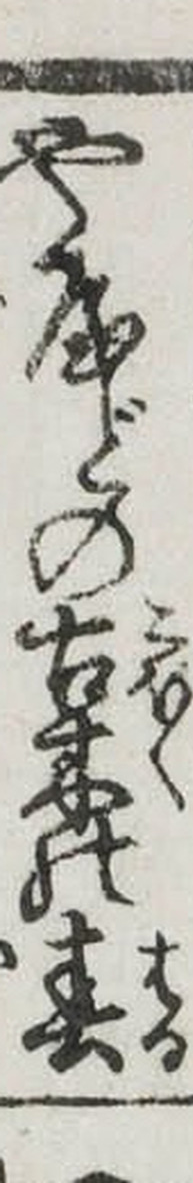ややどの古木の春
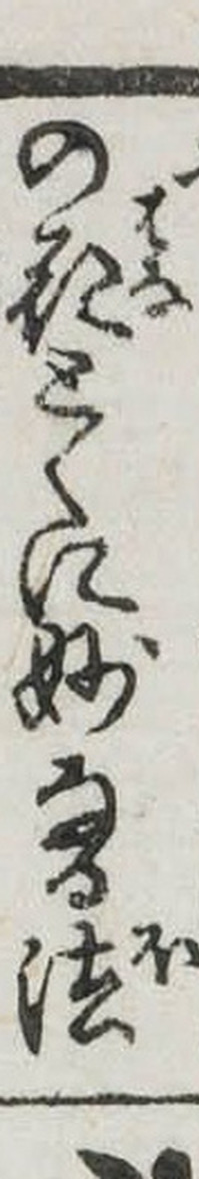の花とくに妙なる法
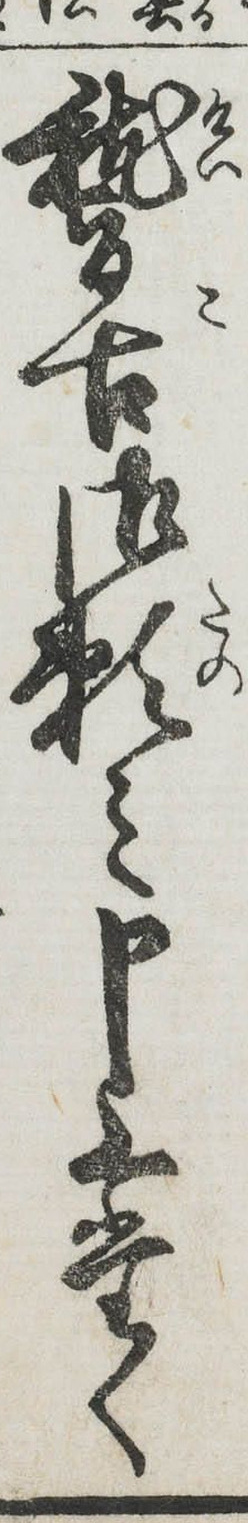稽古御頼み申上たく
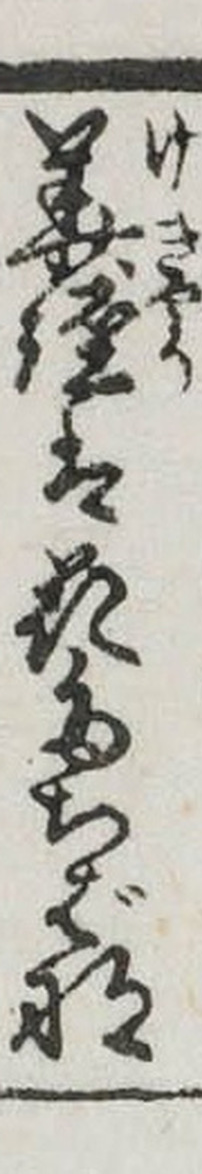華経は花たちばな
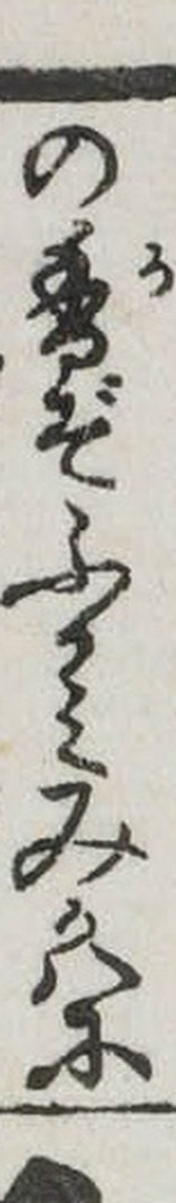の香ぞふかみみかはに
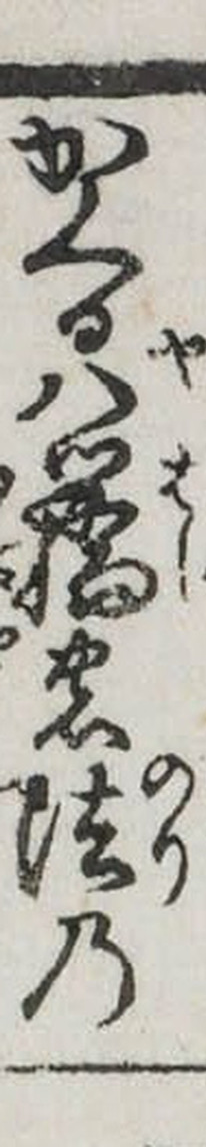かくる八ッ橋の法の
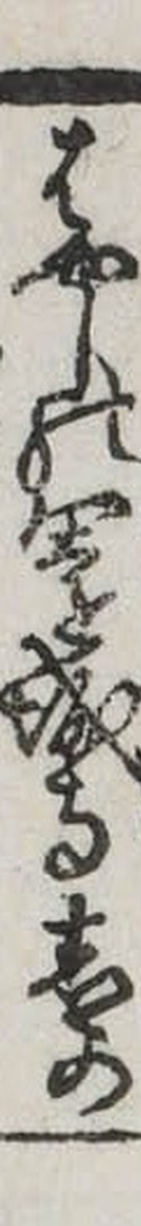はやしの園城寺しか
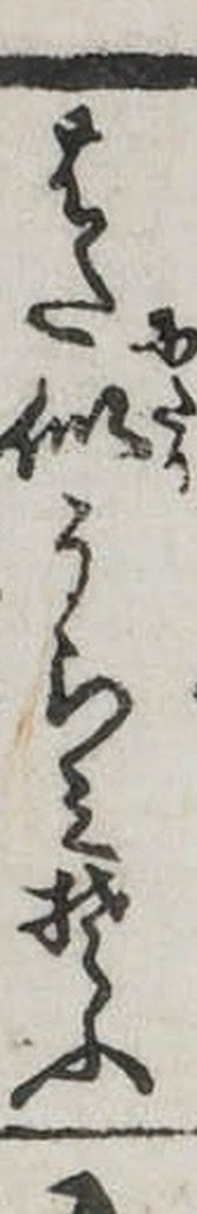はた似うらみそふ
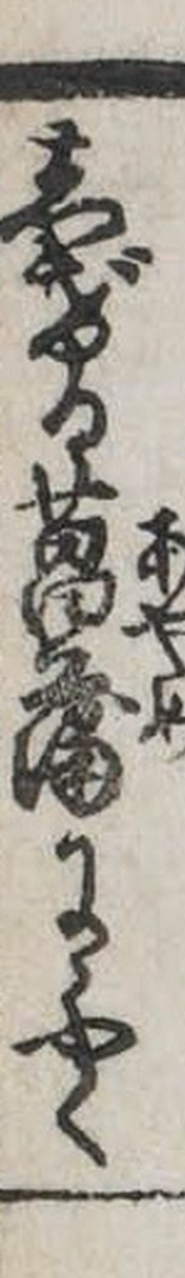しげる菖蒲にふく

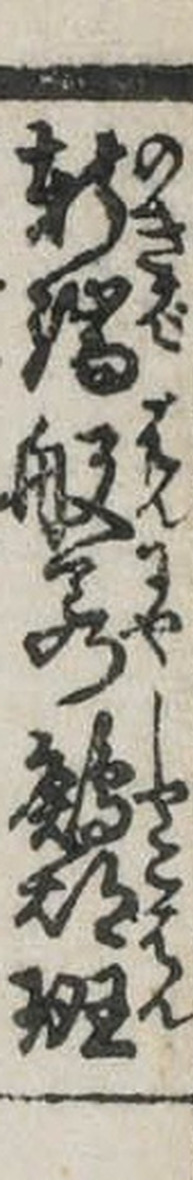軒端般若鷓胡斑
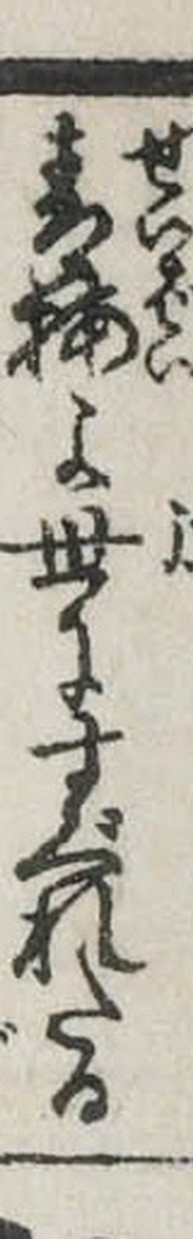青梅よ世にすぐれたる
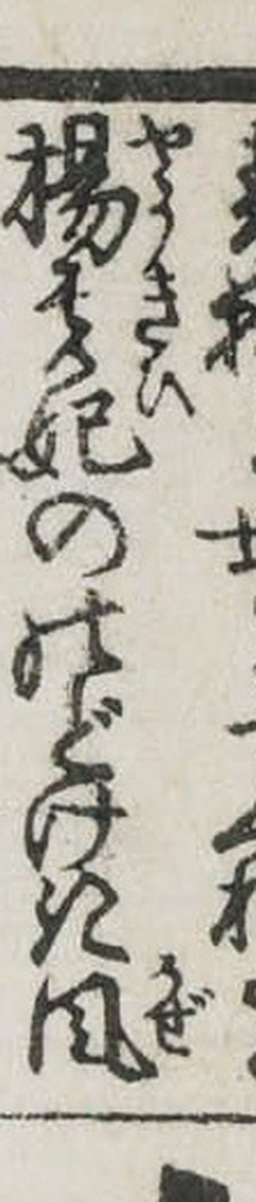楊貴妃ののどけき風
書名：頭書萬用婦人手紙之文言
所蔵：東京学芸大学教育コンテンツアーカイブ
